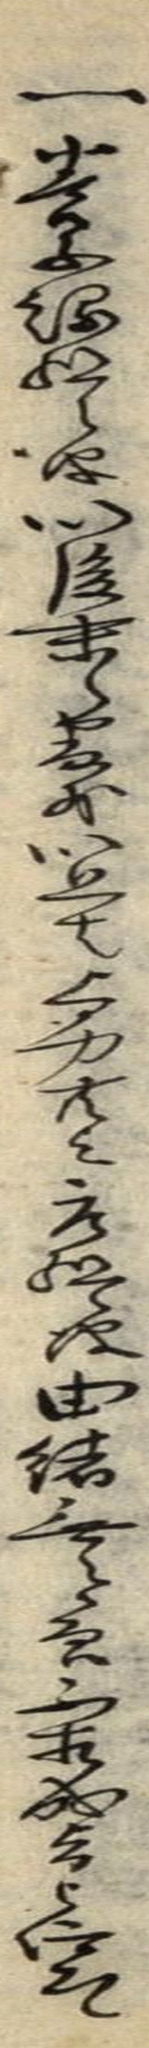一養子縁組之儀以後末之番外以上は与力共に取組候儀由緒無之候ては不相成旨被仰出候
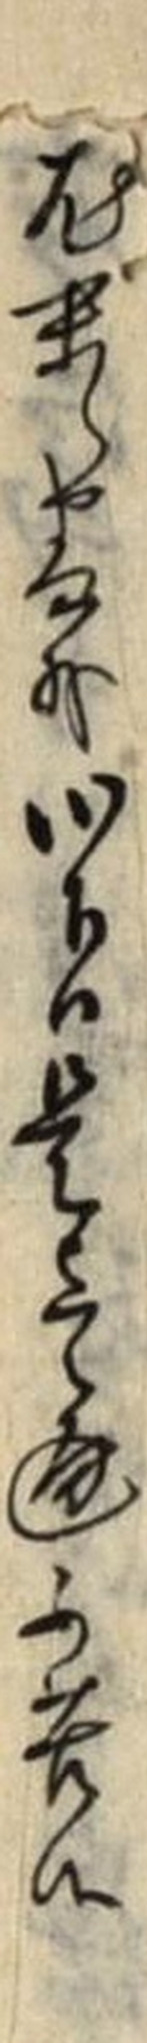尤末之番外以下は是迄之通不苦候

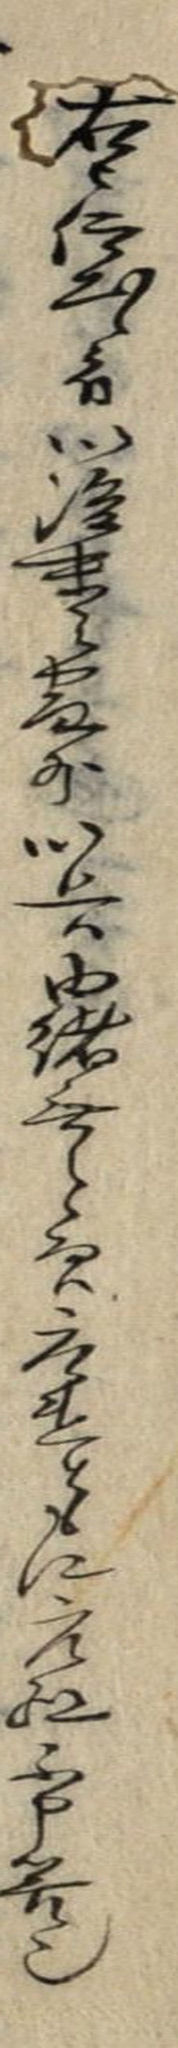右被仰出候ニ付以後末之番外以上ハ由緒無之候而ハ取遣ともに取組不申筈也
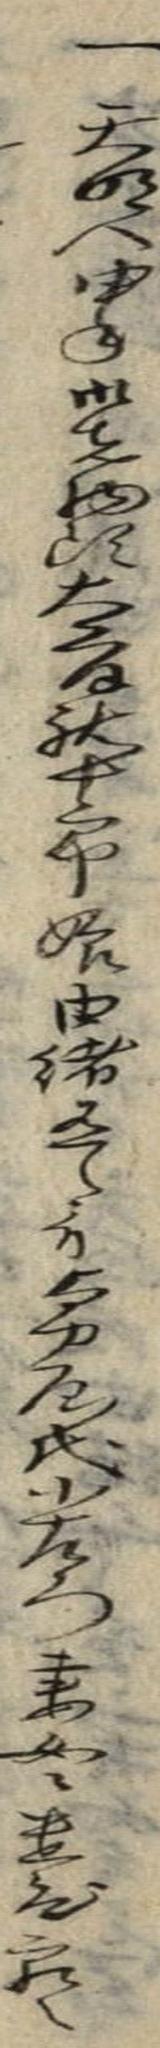一天明八申年御先物頭大藤祐十郎娘由緒有之ニ付与力屋代小左衛門妻女ニ遣度願之
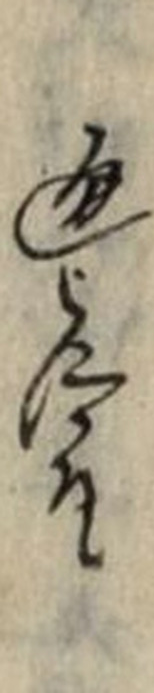通被仰付候
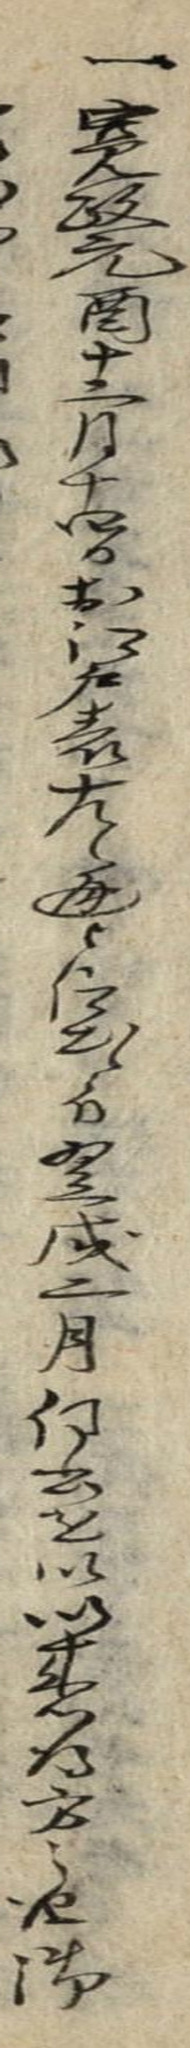一寛政元酉十二月十四日於江戸表左之通被仰出候ニ付翌戌二月伺書を以以来心得方之儀御
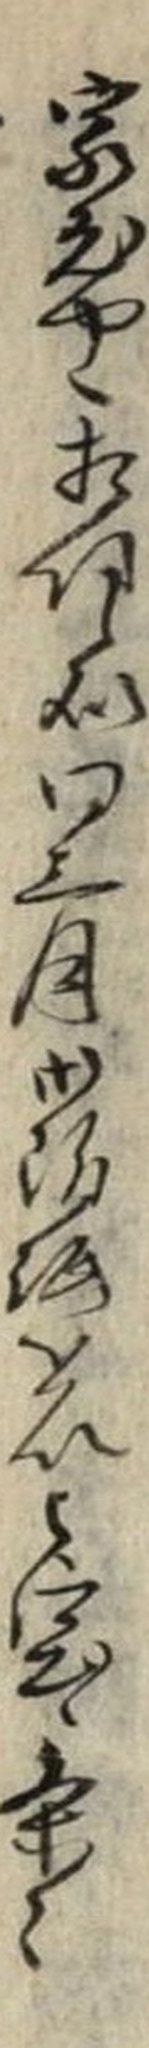家老中ヘ相伺候処同三月御附紙を以被仰出候条々
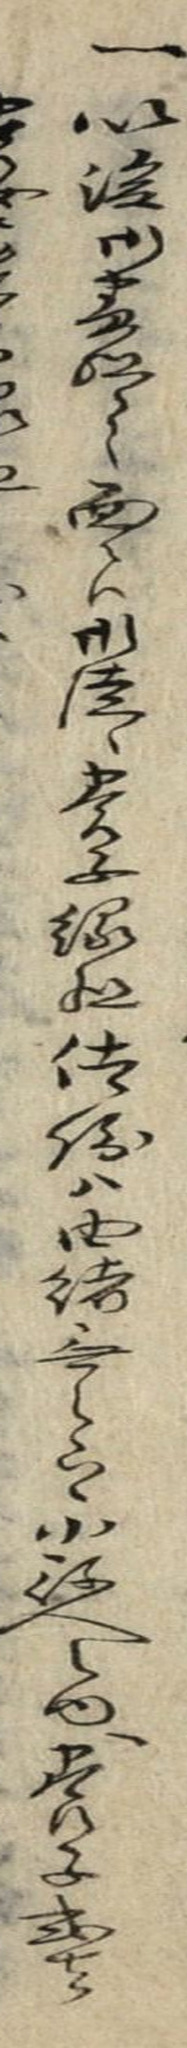一以後御番組之面々ハ御徒之養子縁組仕候儀ハ由緒無之下々小役人之内ヘ養子或者
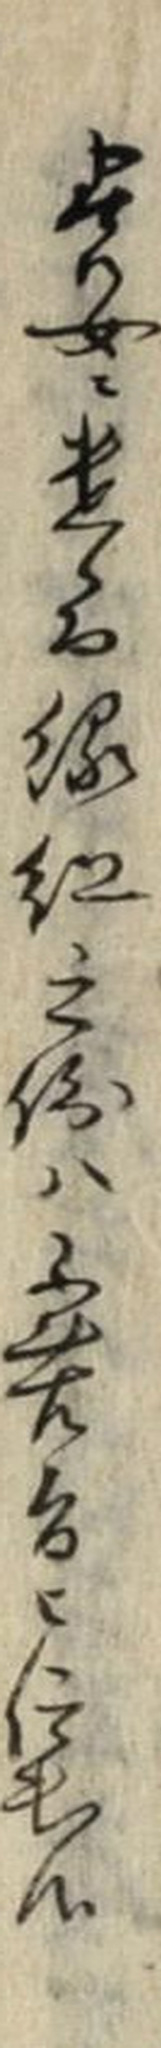養女ニ遣候而縁組之儀ハ不苦旨被仰出候
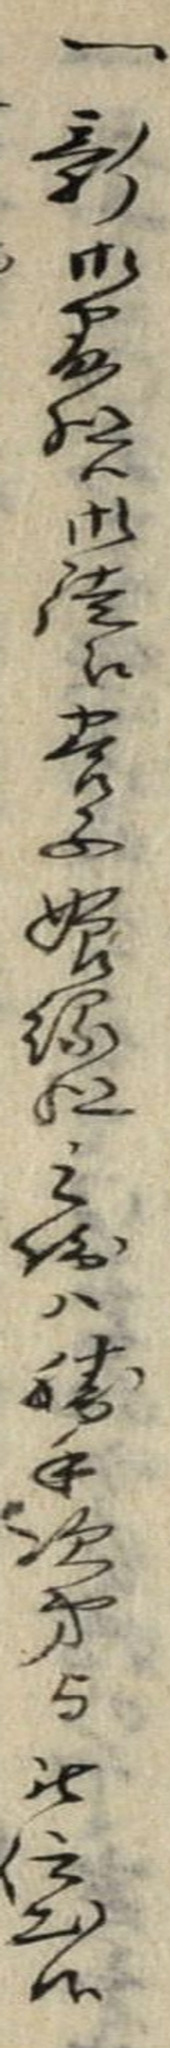一新御番組ハ御徒江養子娘縁組之儀ハ勝手次第与被仰出候
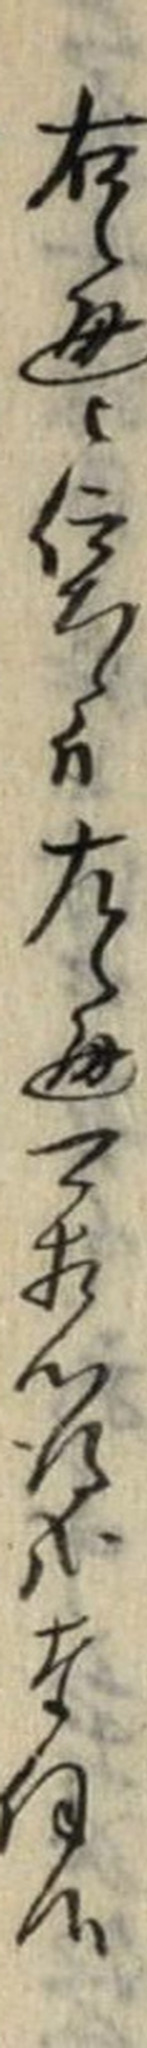右之通被仰出候ニ付左之通可相心得哉奉伺候
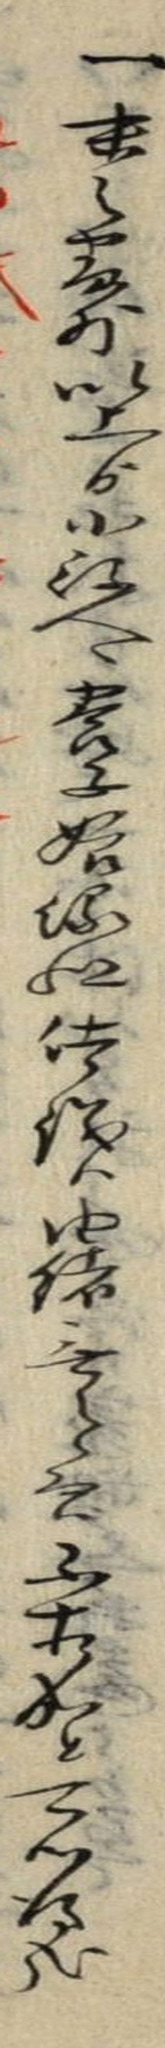一末之番外以上ゟ小役人ヘ養子娘縁組仕候儀ハ由緒無之候而ハ不相成と可心得哉
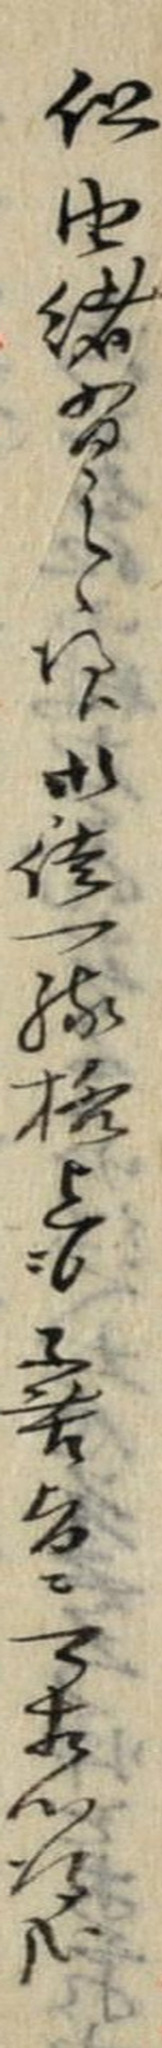但由緒有之候得ハ御徒一統格迄も不苦旨ニ可相心得哉
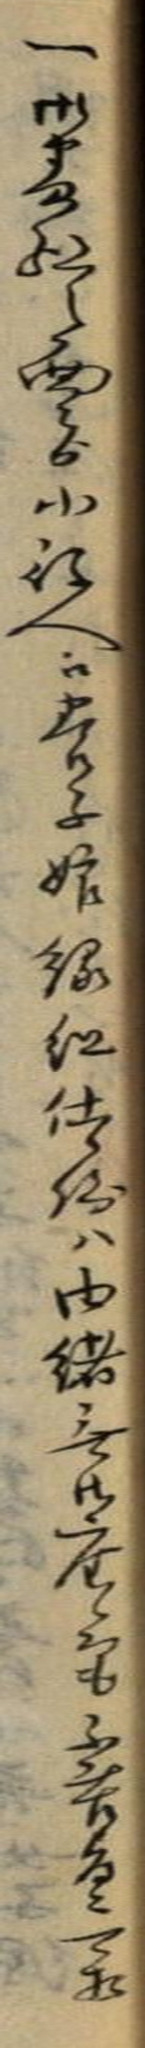一御番組之面々ゟ小役人江養子娘縁組仕候儀ハ由緒無御座候ても不苦旨ニ可相
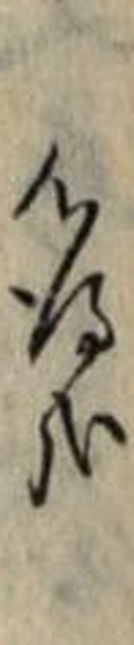心得哉
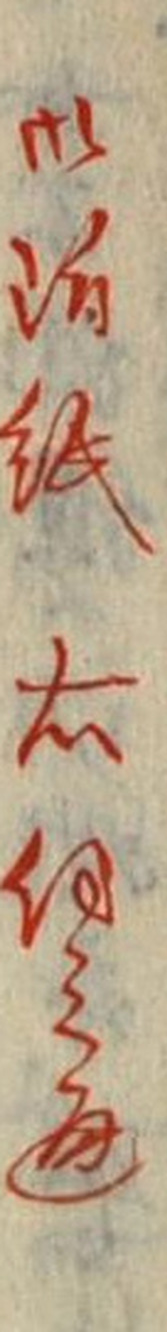御附紙右伺之通
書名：養子縁組之部
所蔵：福井県文書館 Fukui Prefectural Archives
